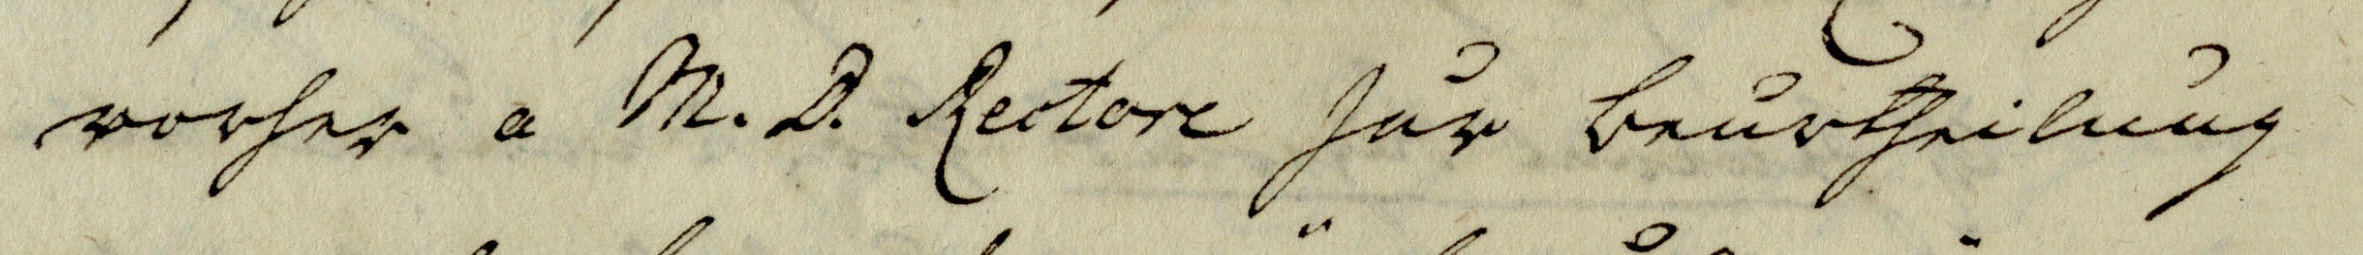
vorher a M. D. Rectore zur Beurtheilung
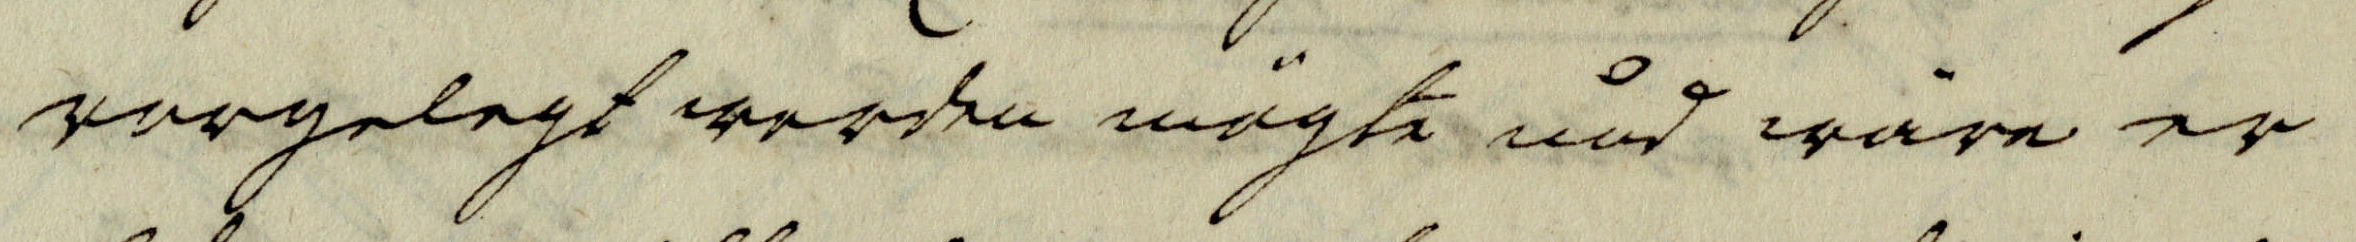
vorgelegt werden mögte und wäre er
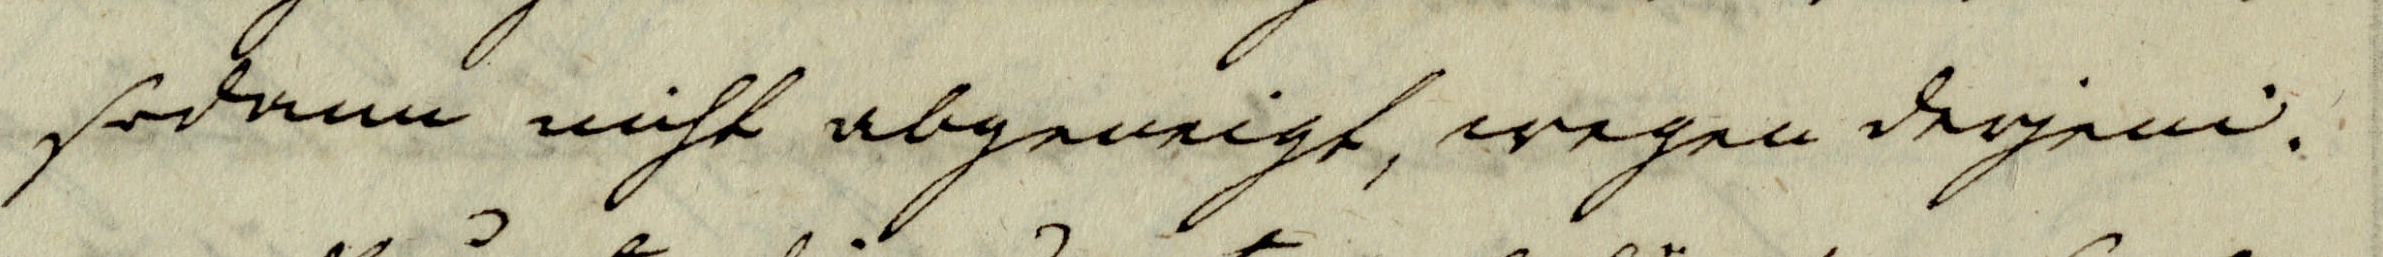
sodann nicht abgeneigt, wegen derjeni¬
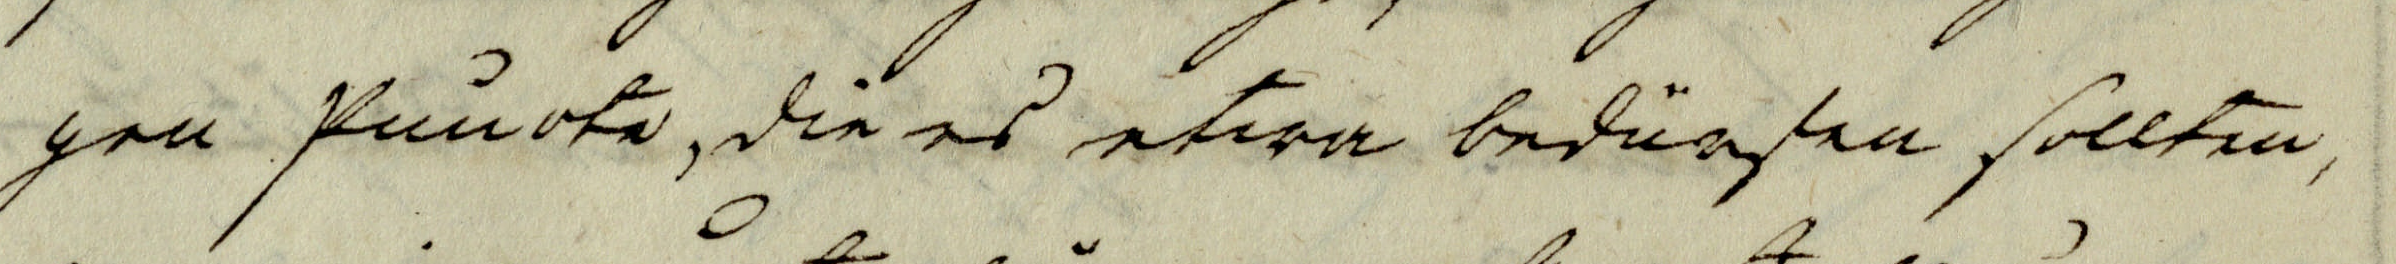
gen Puncte, die es etwa bedürfen sollten,
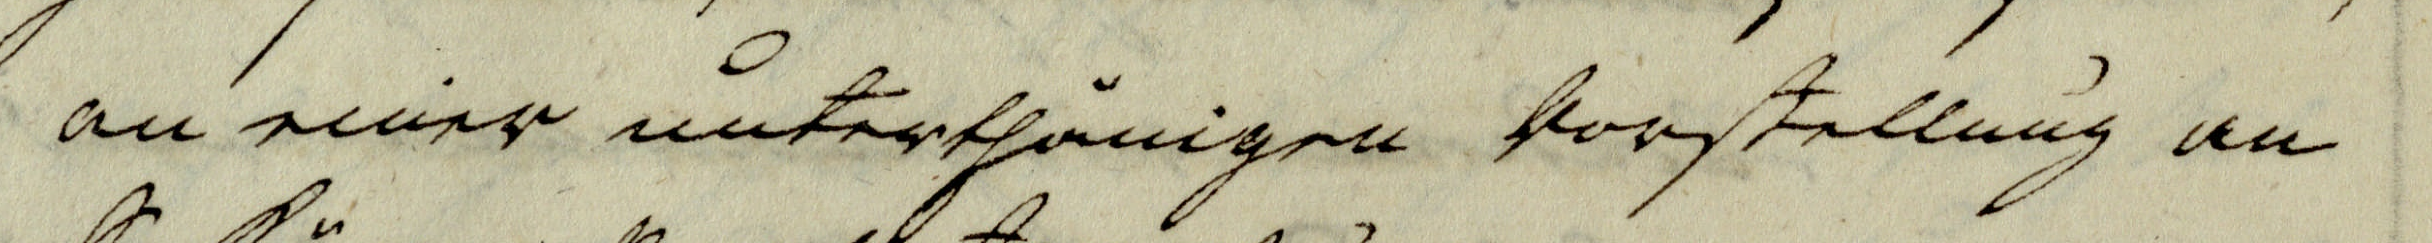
an einer unterthänigen Vorstellung an
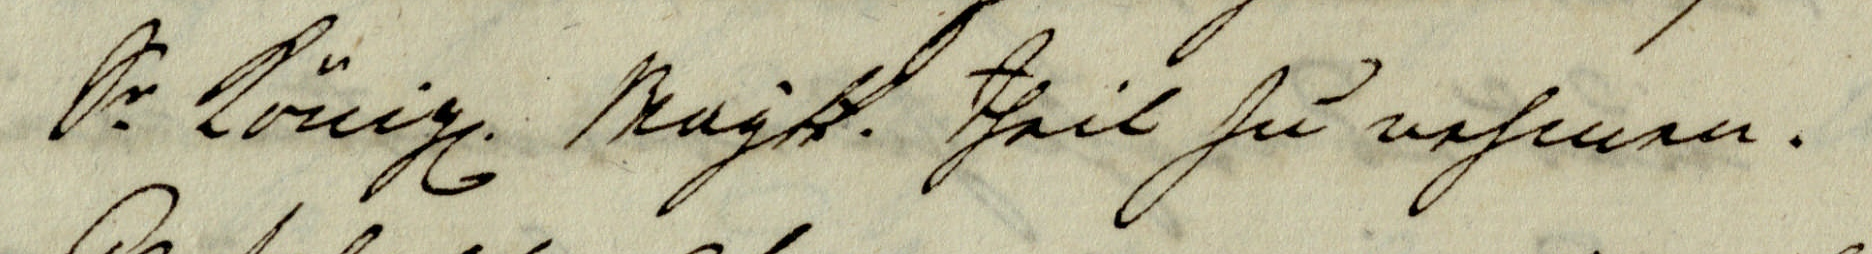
Sr. Königl. Maÿtt. Theil zu nehmen.
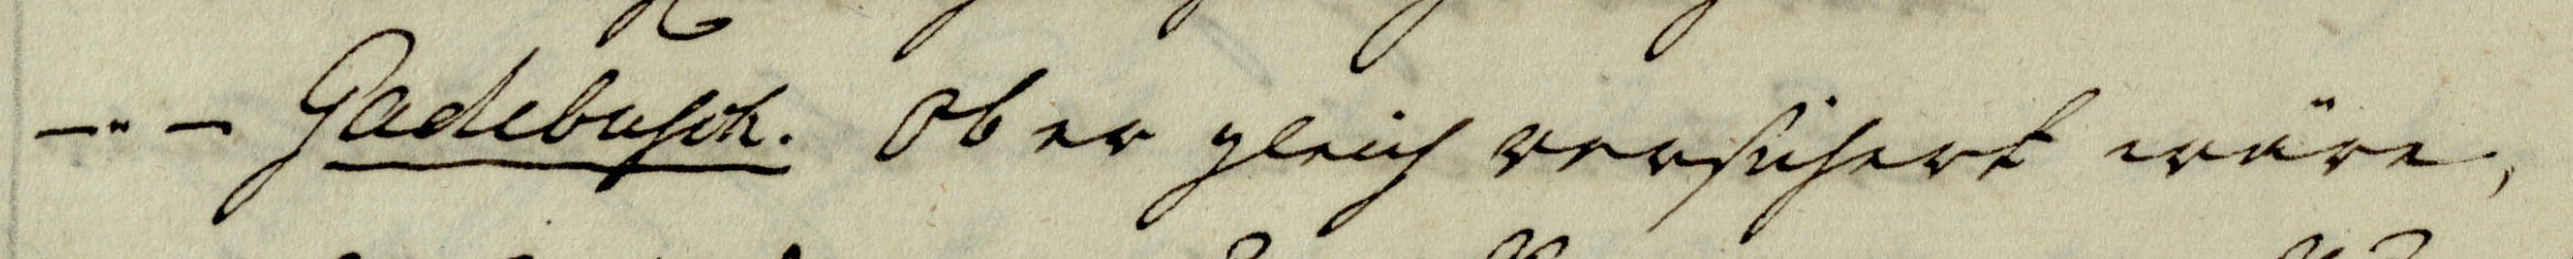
Gadebusch. Ob er gleich versichert wäre,
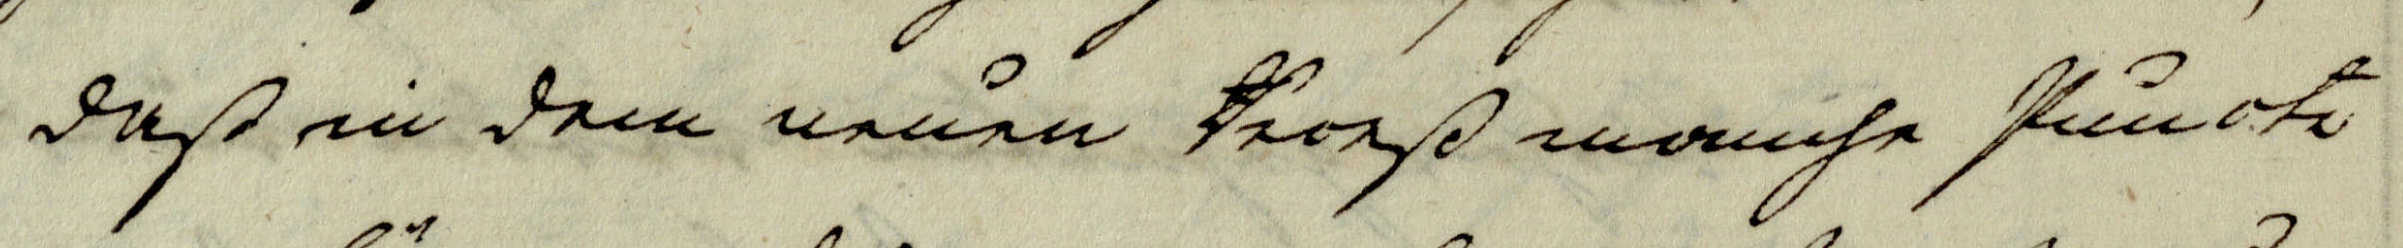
daß in dem neuen Receß manche Puncte
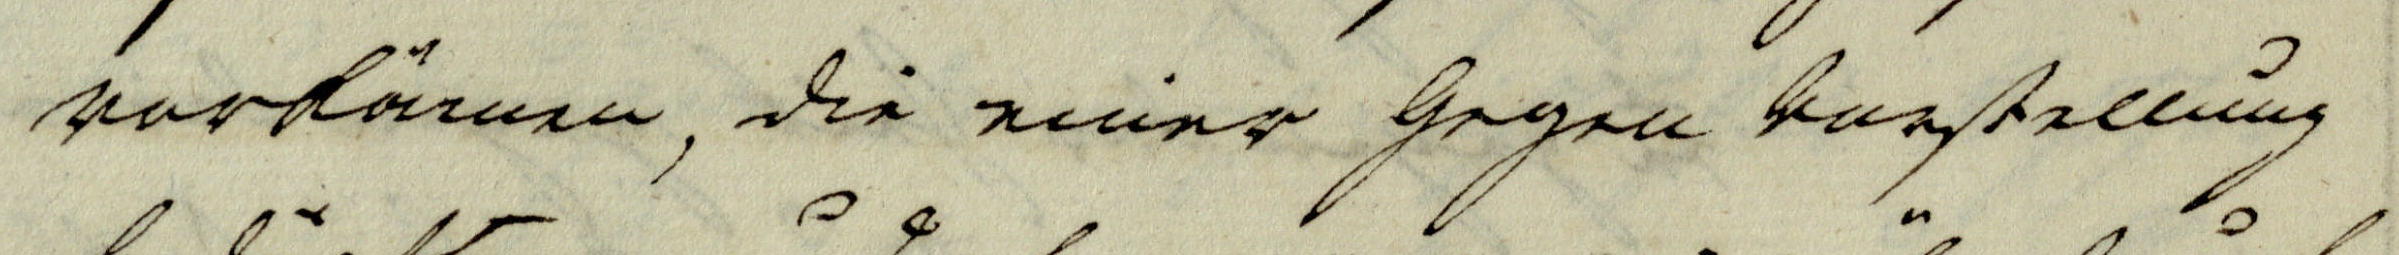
vorkämen, die einer Gegen Vorstellung
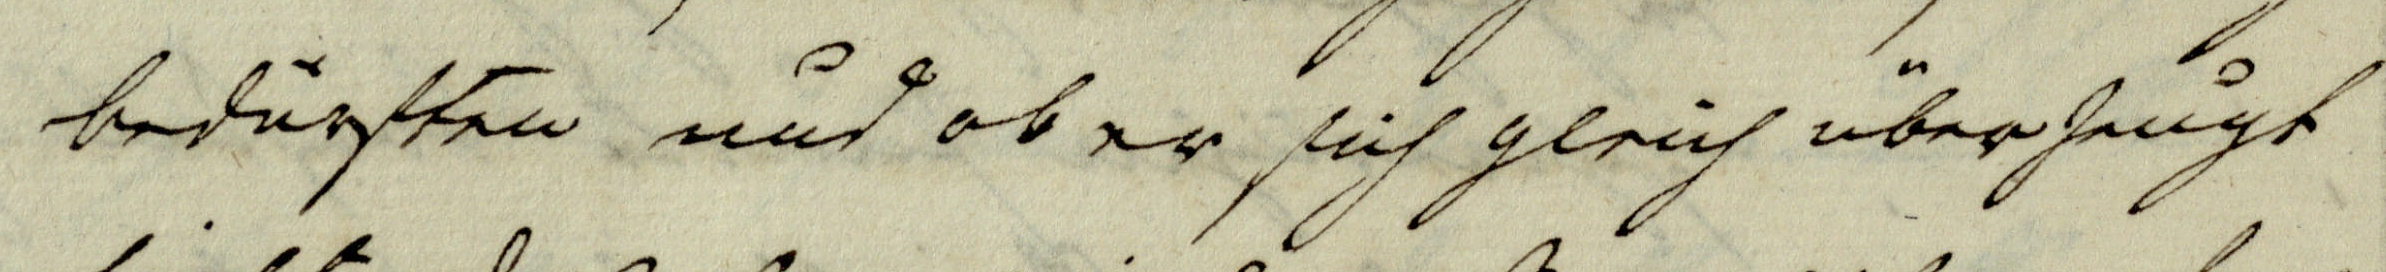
bedürften und ob er sich gleich überzeugt
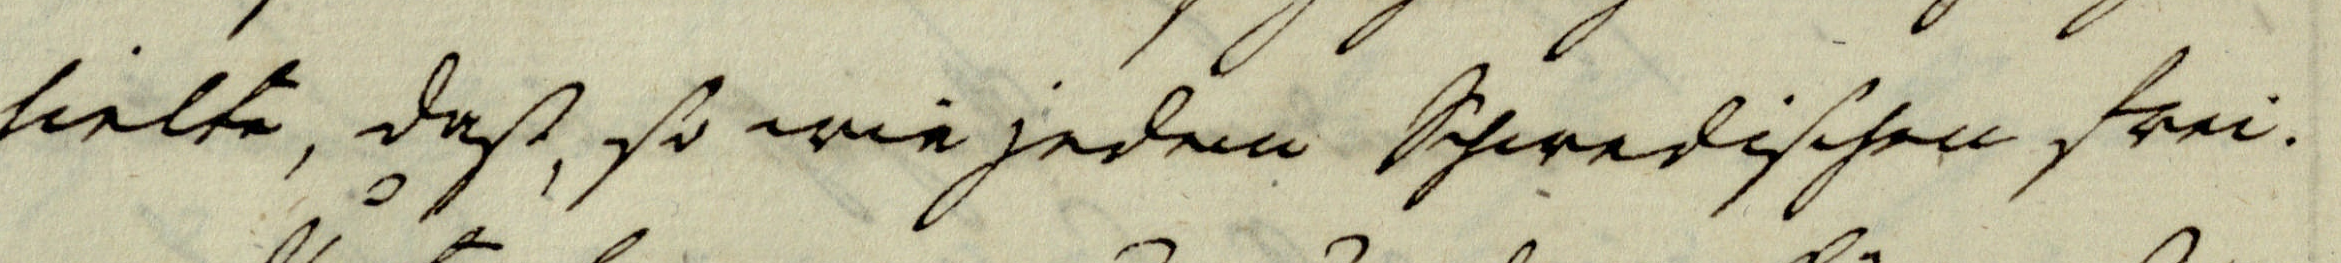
hielte, daß so wie jedem Schwedischen frei¬
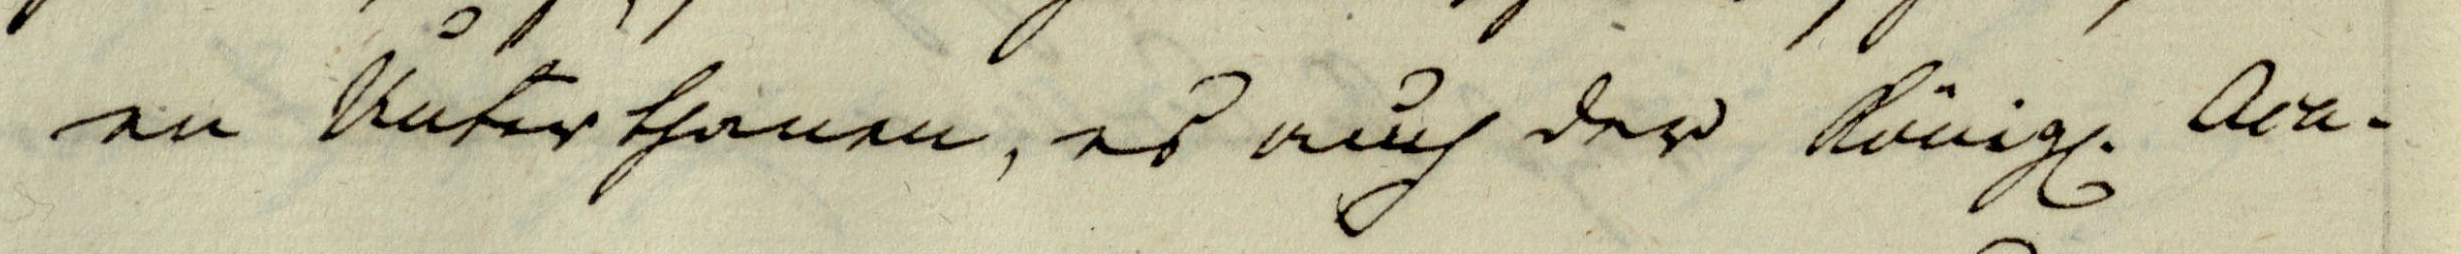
en Unterthanen, es auch der Königl. Aca¬
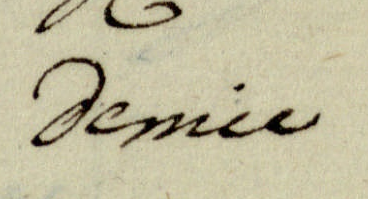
demie
